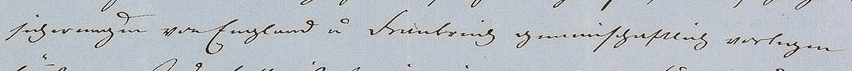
sicherungen von England u Frankreich gemeinschaftlich vorlegen
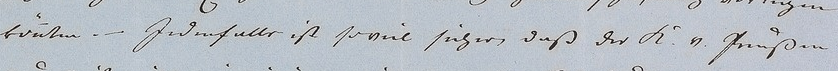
könnten. – Jedenfalls ist soviel sicher, daß der K. v. Preußen
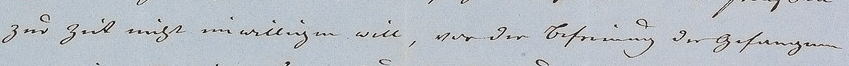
zur Zeit nicht einwilligen will, vor der Befreiung der Gefangenen
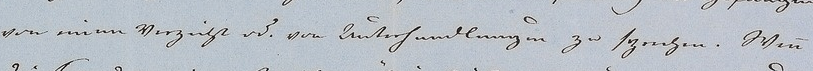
von einem Verzicht od. von Unterhandlungen zu sprechen. Wenn
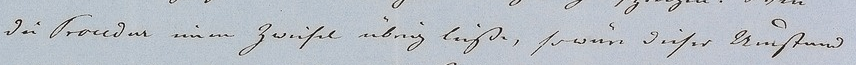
die Procedur einen Zweifel übrig ließe, so wäre dieser Umstand
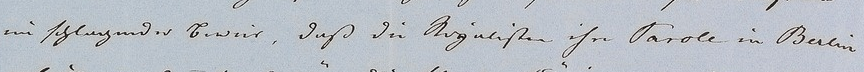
ein schlagender Beweis, daß die Royalisten ihre Parole in Berlin
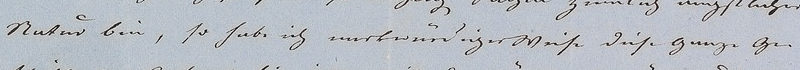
Natur bin, so habe ich merkwürdiger Weise diese ganze Ge-
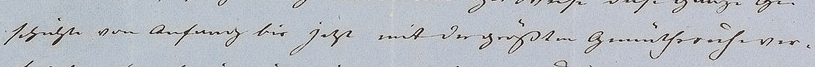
schichte von Anfang bis jetzt mit der größten Gemüthsruhe ver-
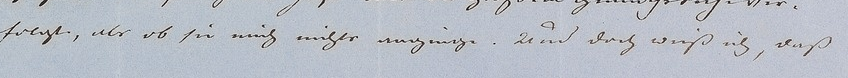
folgt, als ob sie mich nichts anginge. Und doch weiß ich, daß
